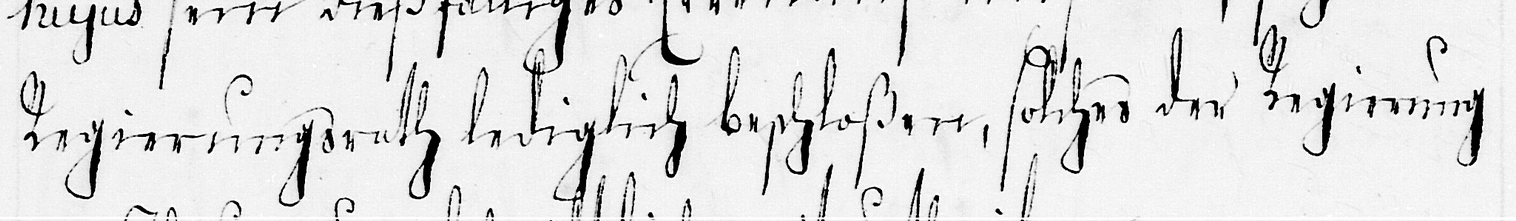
Regierungsrath lediglich beschloßen, solches der Regierung
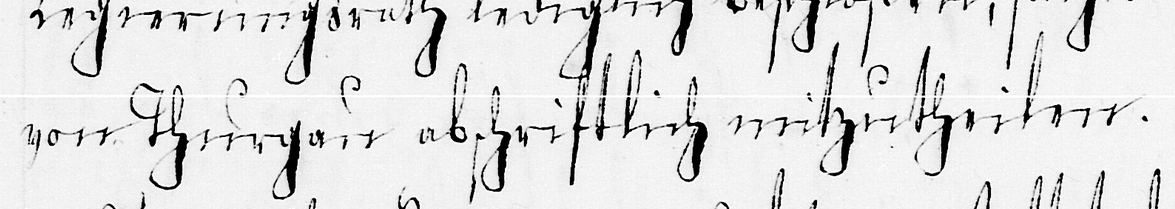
von Thurgau abschriftlich mitzutheilen.
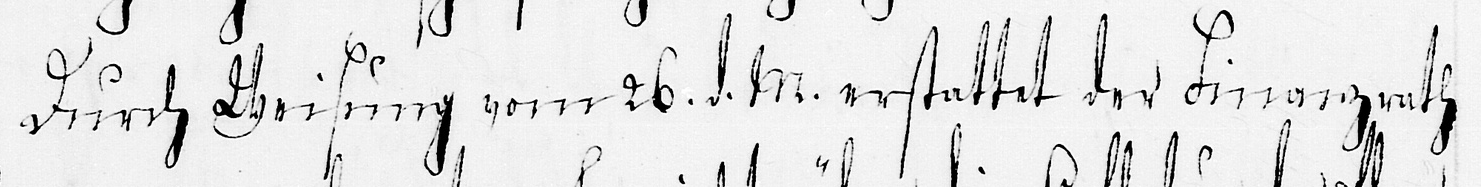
Durch Weisung vom 26. d. M. erstattet der Finanzrath
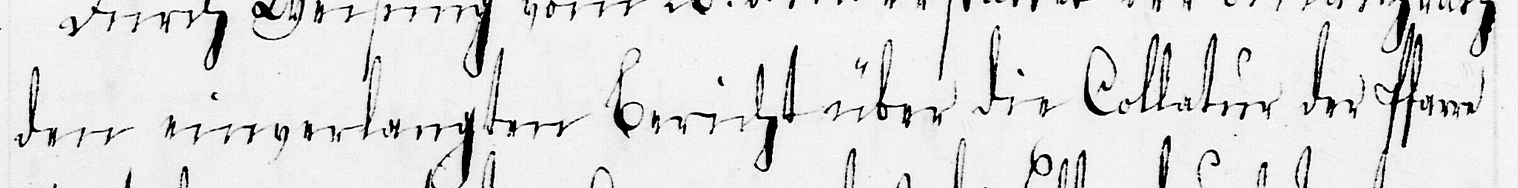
den einverlangten Bericht über die Collatur der Pfarre
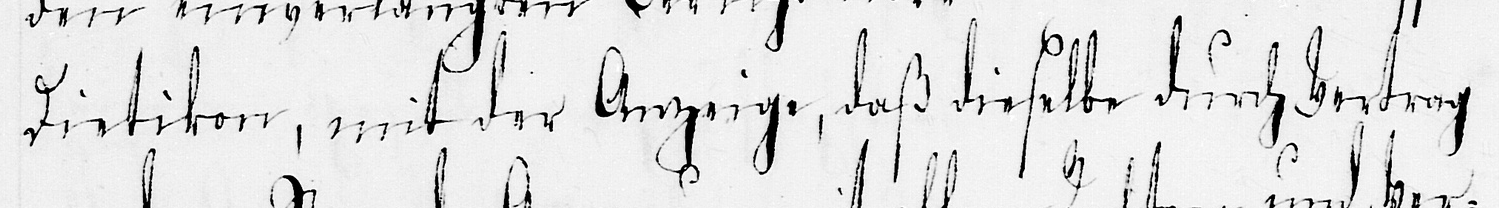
Dietikon, mit der Anzeige, daß dieselbe durch Vertrag
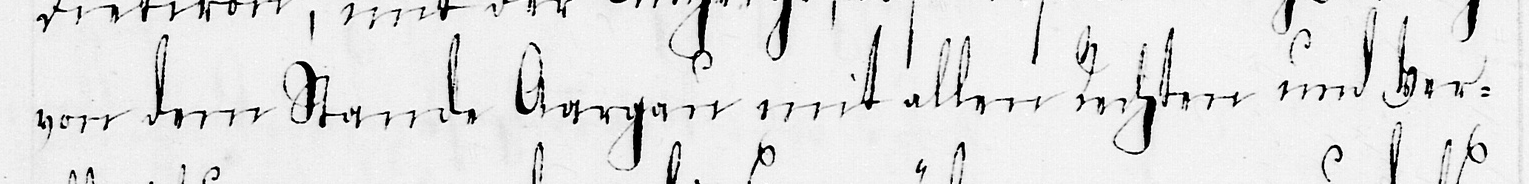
von dem Stande Aargau mit allen Rechten und Ver¬
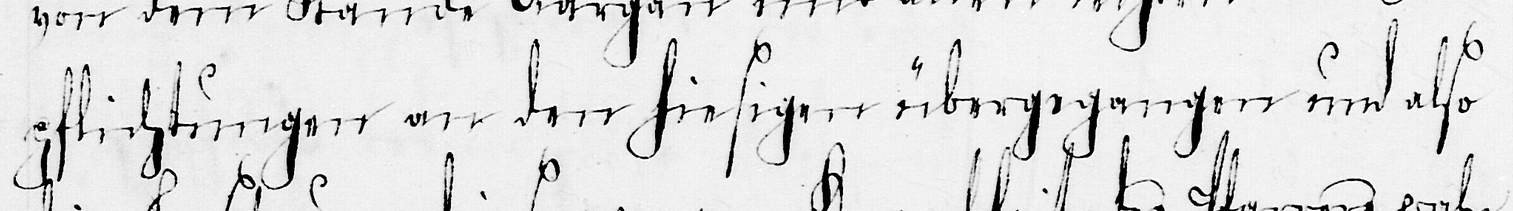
pflichtungen an den hiesigen übergegangen und also
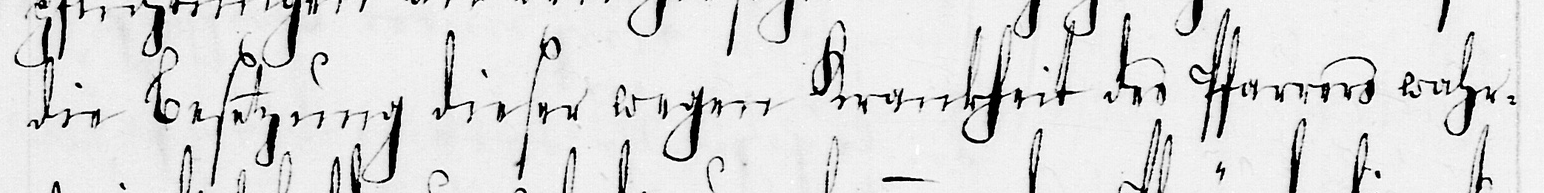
die Besetzung dieser wegen Krankheit des Pfarrers wahr¬
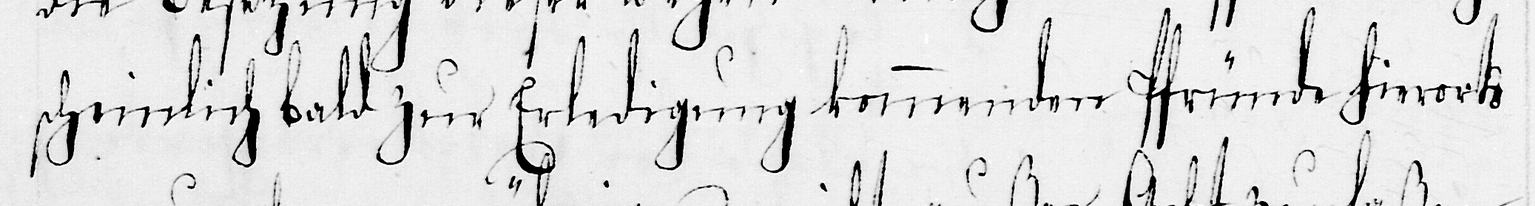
scheinlich bald zur Erledigung kommenden Pfründe hierorts
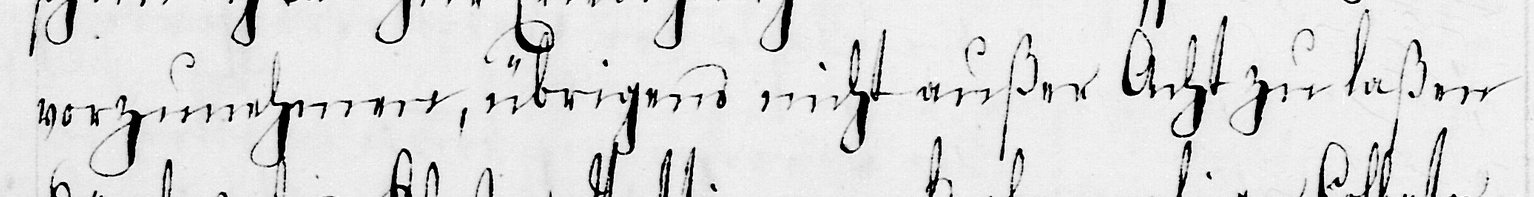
vorzunehmen, übrigens nicht außer Acht zu laßen
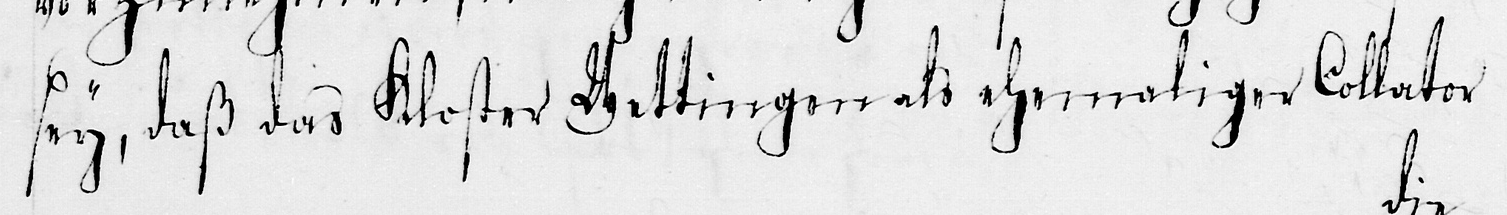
sey, daß das Kloster Wettingen als ehemaliger Collator
